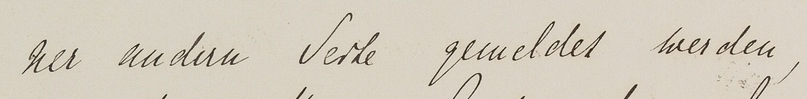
ner andern Seite gemeldet werden,
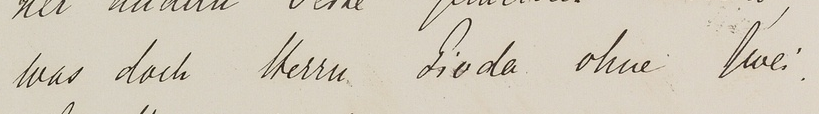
was doch Herr Pioda ohne Zwei-
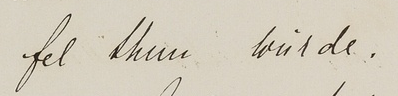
fel thun würde.
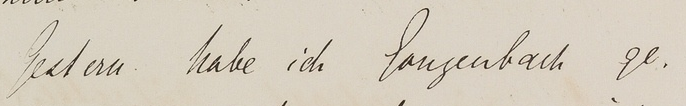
Gestern habe ich Gonzenbach ge-
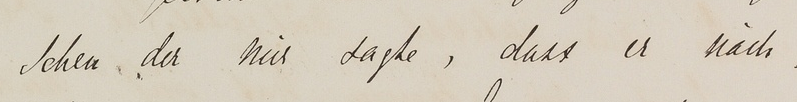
sehen der mir sagte, dass er näch-
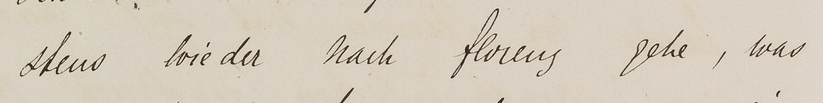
stens wieder nach Florenz gehe, was
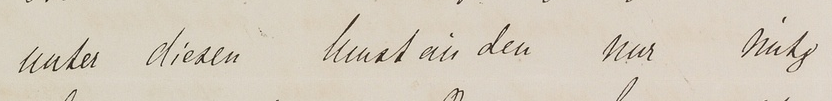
unter diesen Umständen nur nütz-
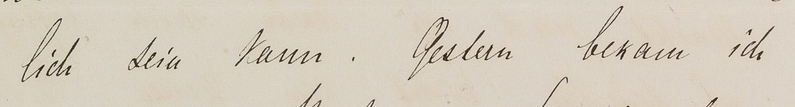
lich sein kann. Gestern bekam ich
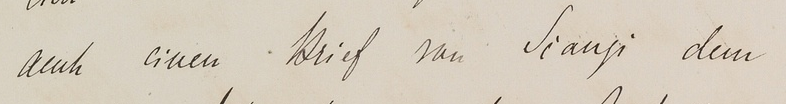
auch einen Brief von Scanzi dem
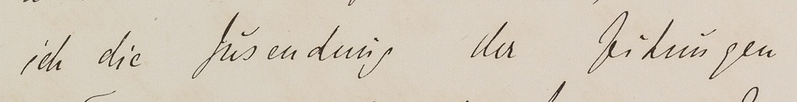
ich die Zusendung der Zeitungen
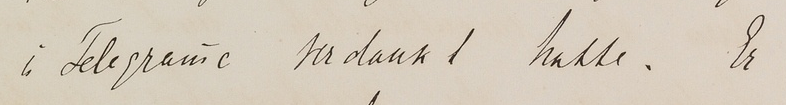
u Telegramme verdankt hatte. Er
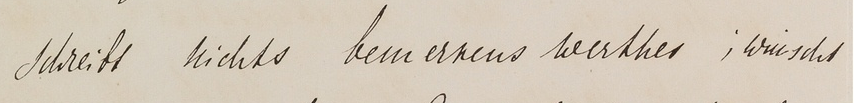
schreibt nichts bemerkenswerthes; wünscht
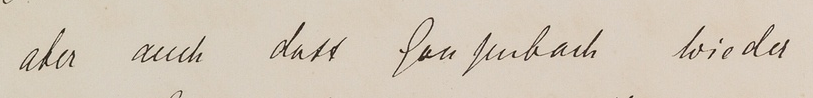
aber auch dass Gonzenbach wieder
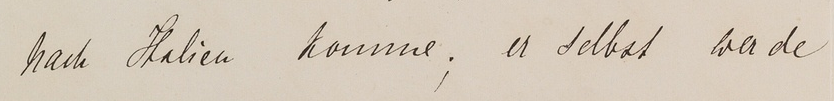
nach Italien komme; er selbst werde
